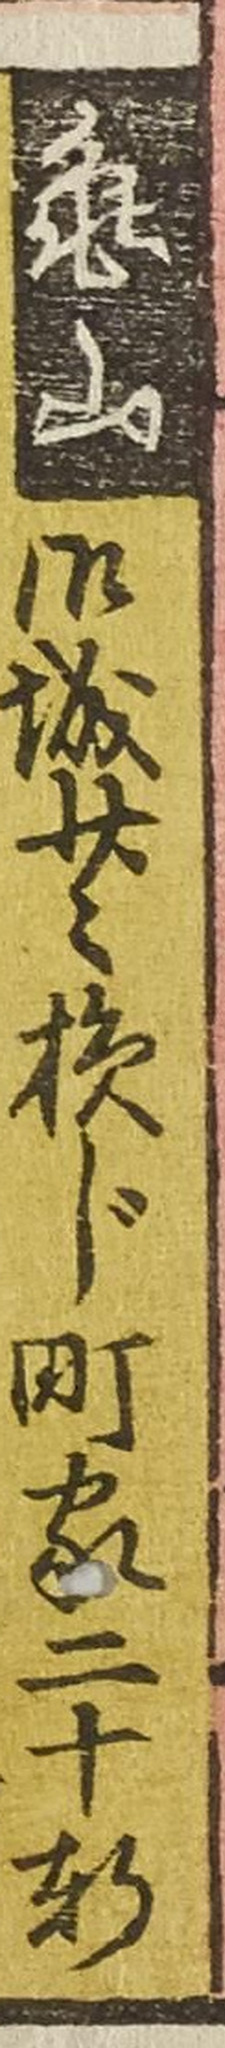亀山御城少々損じ町家二十軒
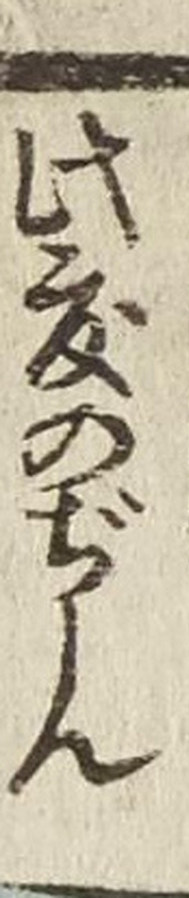此度のぢしん
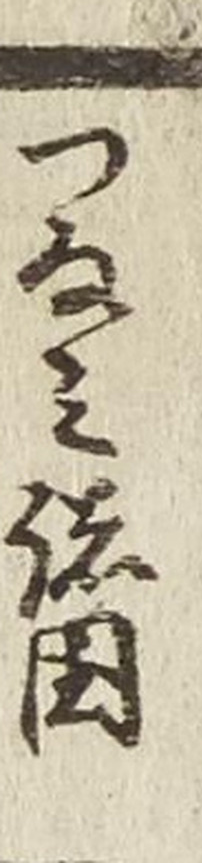つなみ諸国
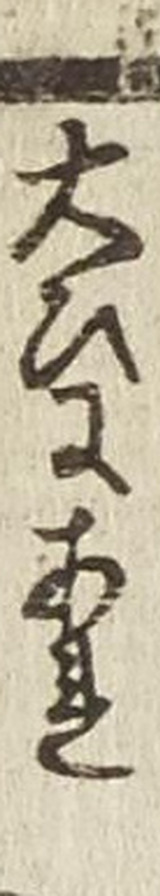大ひにあれ
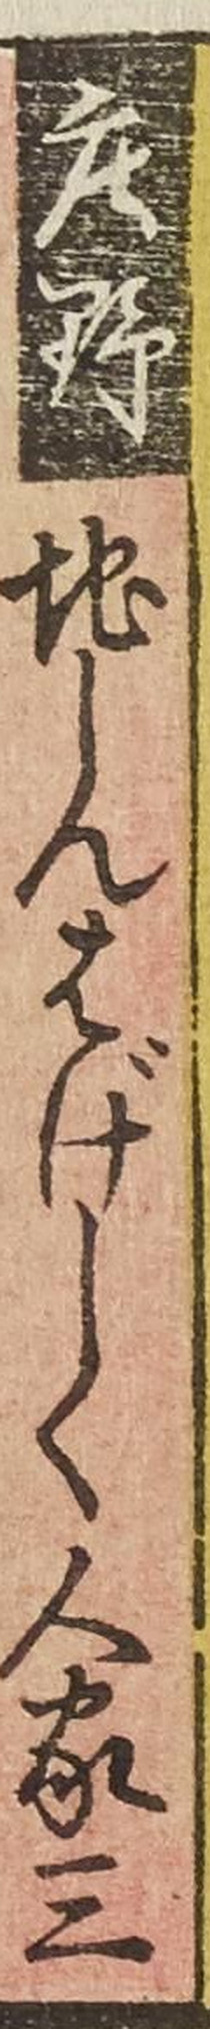ぢしんはげしく人家
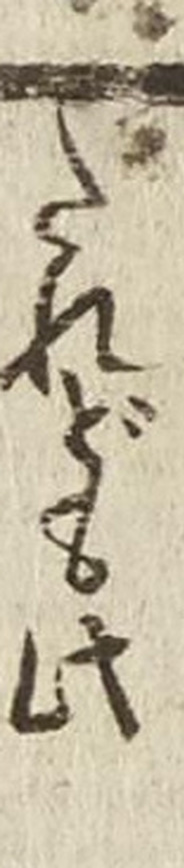たれども此
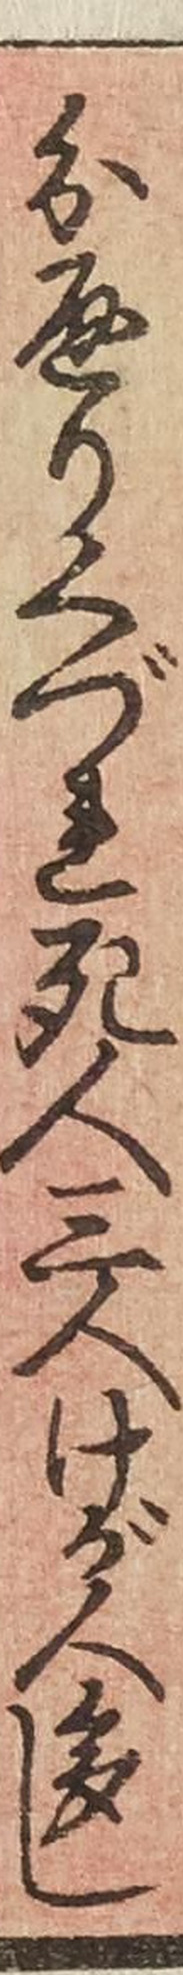分通りくづれ死人三人けが人多し
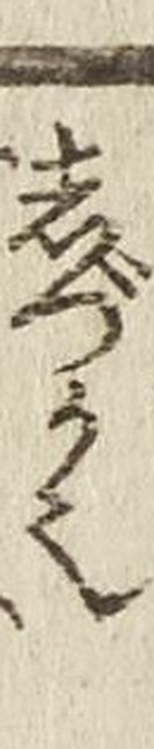しづか也
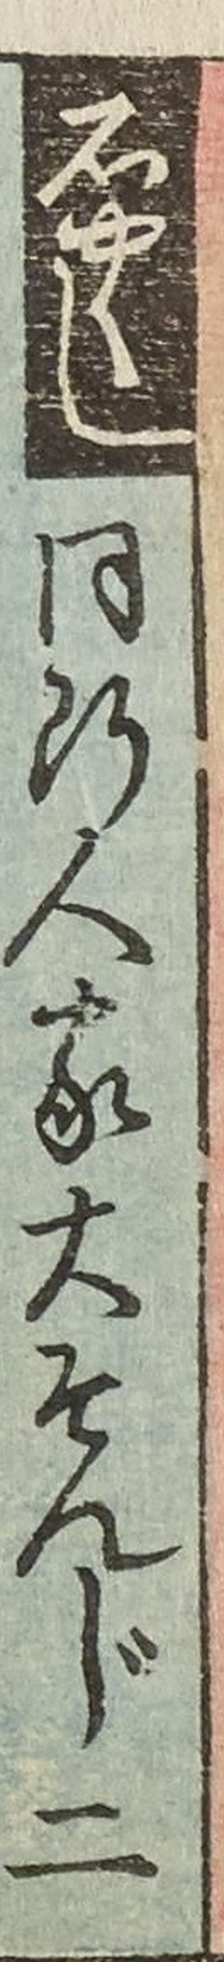石やくし同断人家大そんじ二
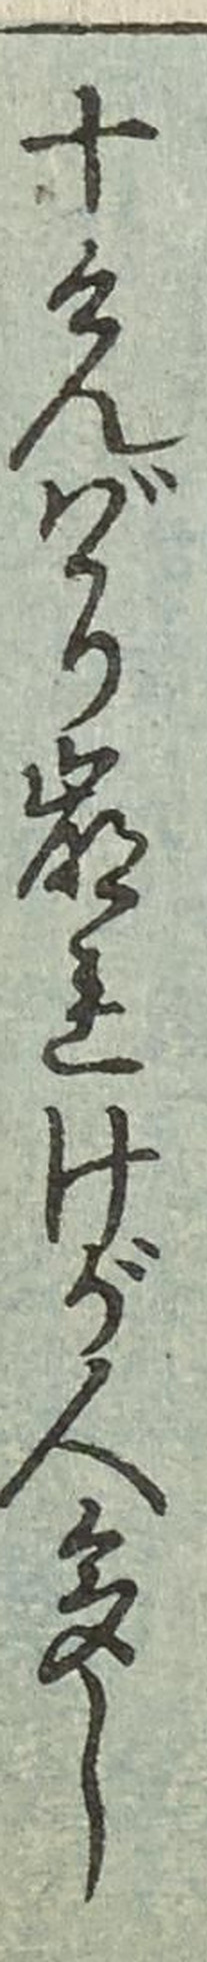十けんばかり崩れけが人多し
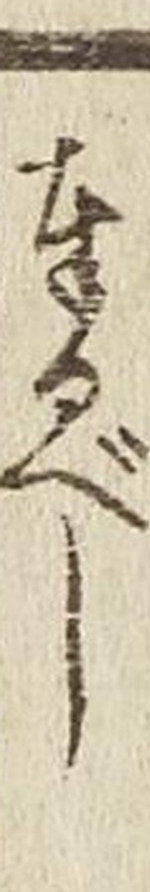奉るべし
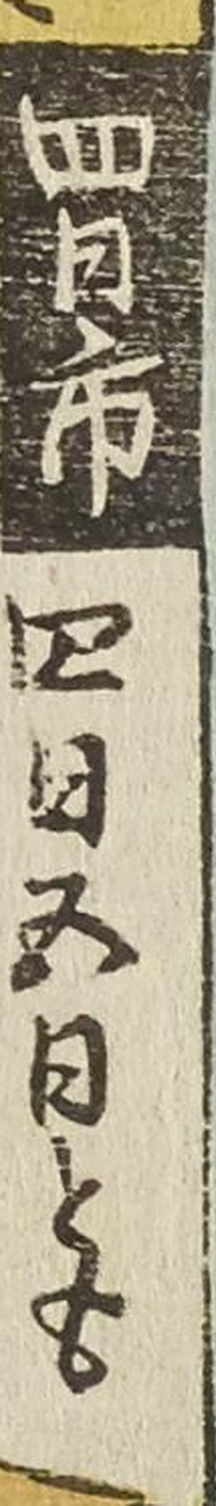四日市四日五日とも
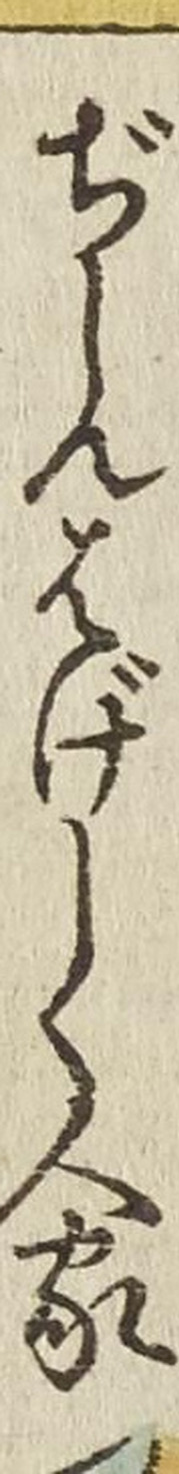ぢしんはげしく人家
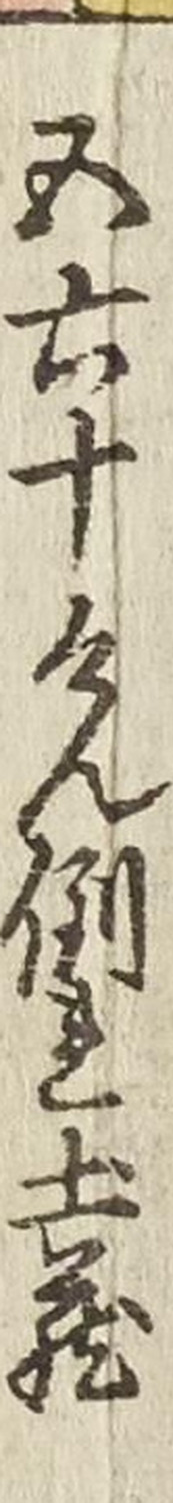五六十けん倒れ土蔵
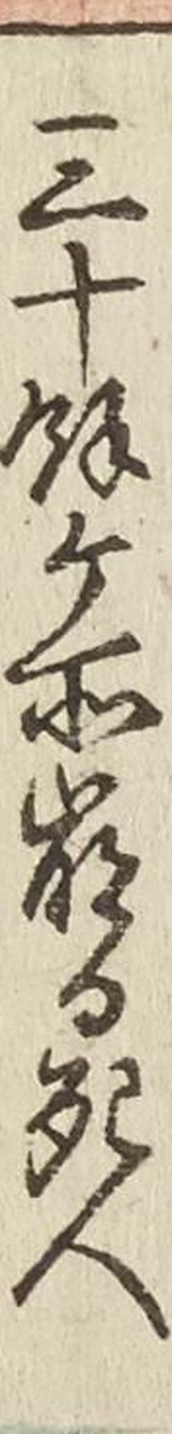三十余ヶ所崩る死人
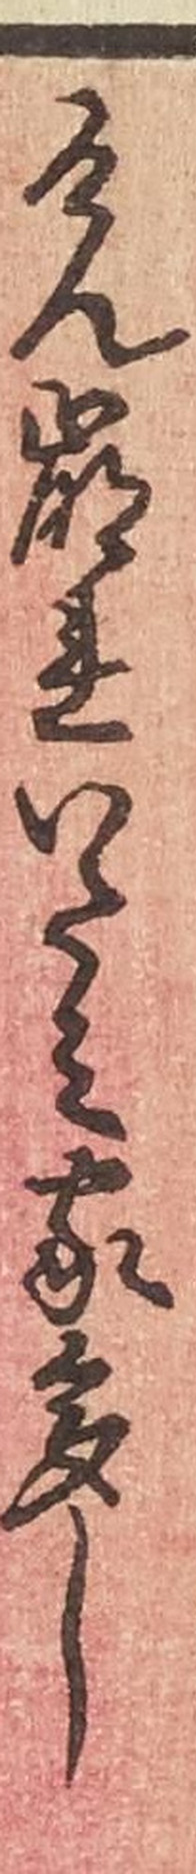けん崩れいたみ家多し
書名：大地震大津浪末代噺種　（二編　全）
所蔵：東京大学地震研究所図書室 Earthquake Research Institute Library, The University of Tokyo, JAPAN
